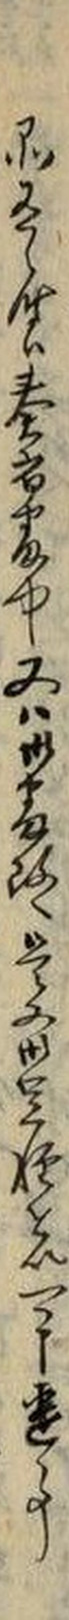品有之時ハ奏者番中又ハ御番改へ是又御足軽を以可申遣事
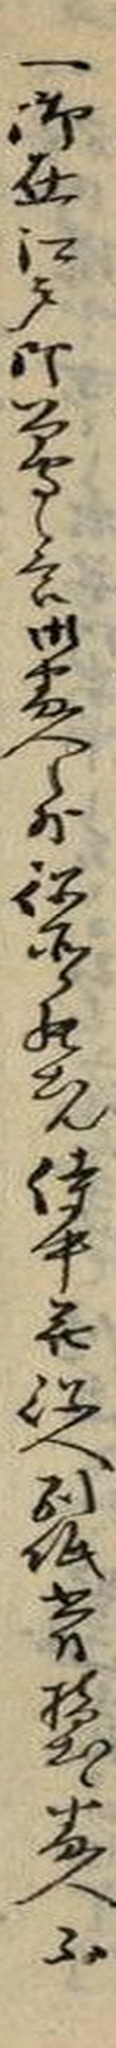一御在江戸御留守之節御番人之外役所へ罷出候侍中并役人別紙書付指出候番人不
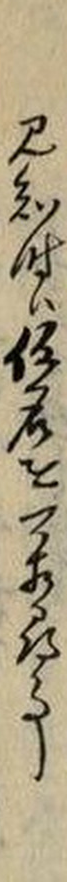見知時ハ仮名を可相尋事
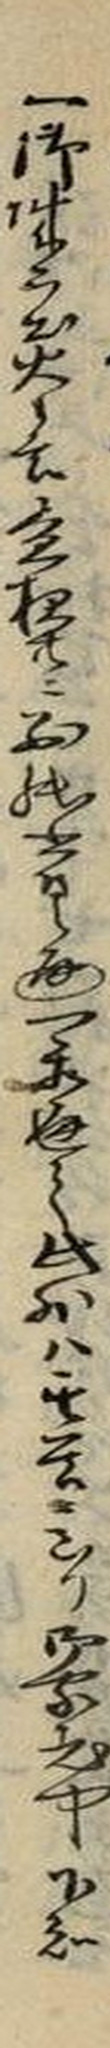一御城下出火之節昼夜共ニ別紙書付之通可相通之此外ハ其節ニ至り御家老中下知
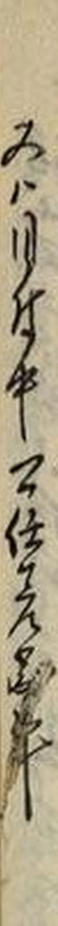又ハ目付中可任差図事
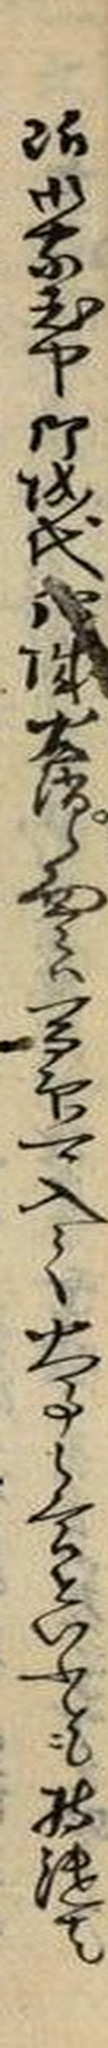附御家老中御城代御城火消◦定火消之面々ハ馬印可入之火事之節といふとも持継ぎ者
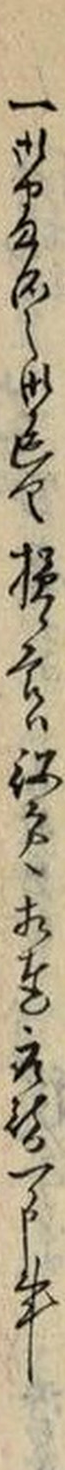一御番所之御道具損候節ハ役方へ相達取替可申事
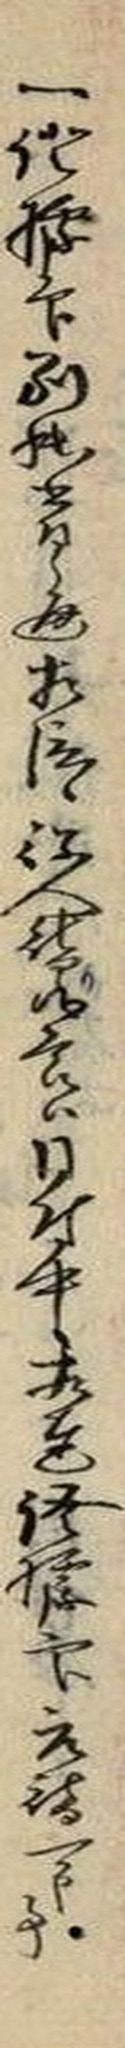一証拠印別紙書付之通相渡候役人替り候節ハ目付中へ相達証拠印取替可申事
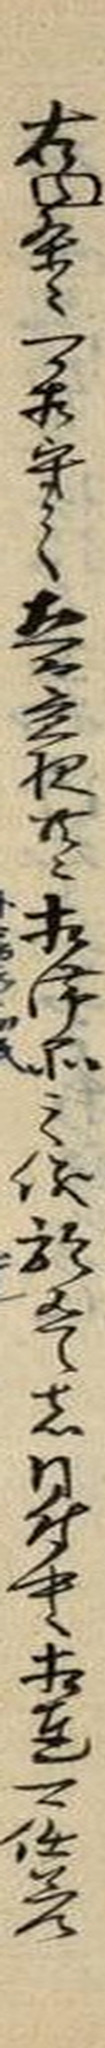右条々可相守之惣而昼夜共ニ相滞品之儀於有之者目付中へ相達可任差
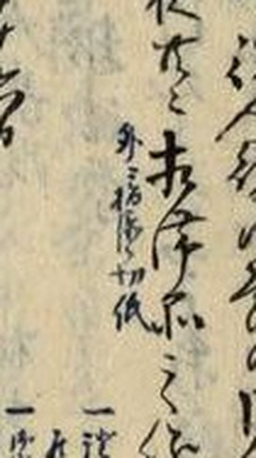外ニ指添候切紙
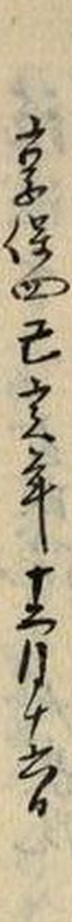享保四己寅年十二月十六日
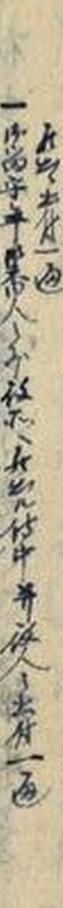一御留守年御番人之外役所へ罷出ル侍中并役人之書付一通
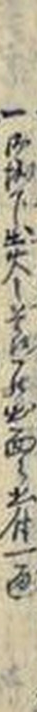一御城下出火之節罷出面々書付一通
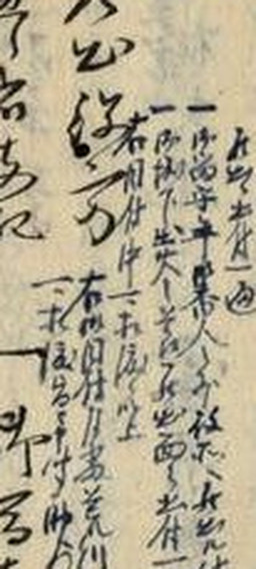右目付中可相渡候以上
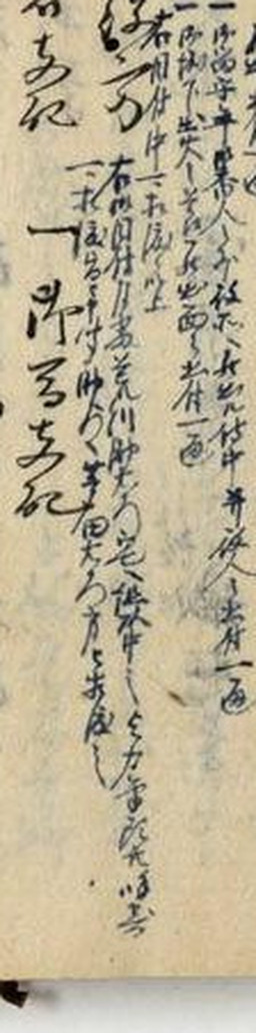右御目付月番荒川助右衛門宅へ組頭中之与力番頭共呼寄
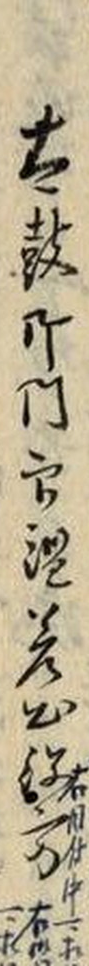太鼓御門印鑑差出役方
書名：御門御櫓之部
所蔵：福井県文書館 Fukui Prefectural Archives
